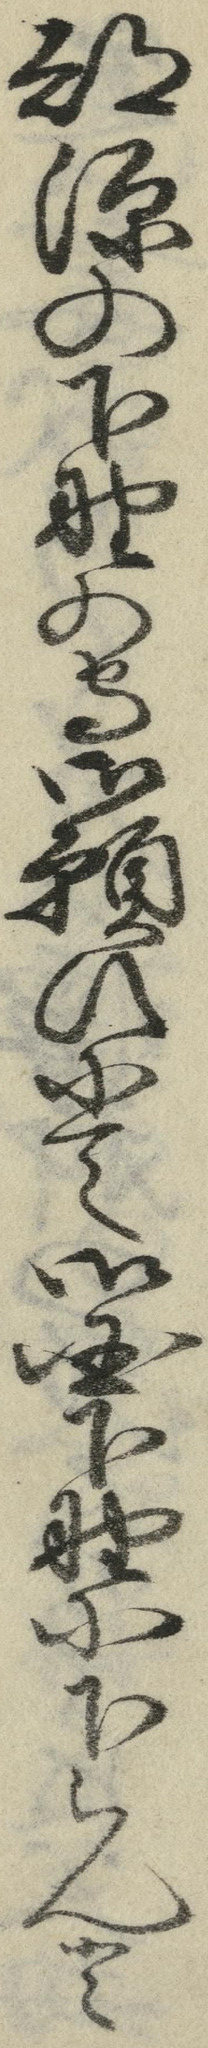都源の下野の守御願ひにて御国下野に下らんと
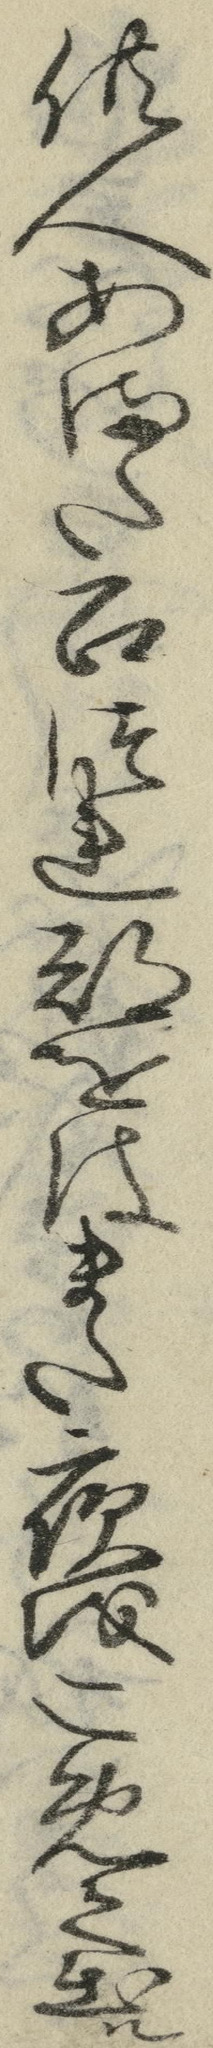供人あまた召つれ都をはまた夜をこめて出ル
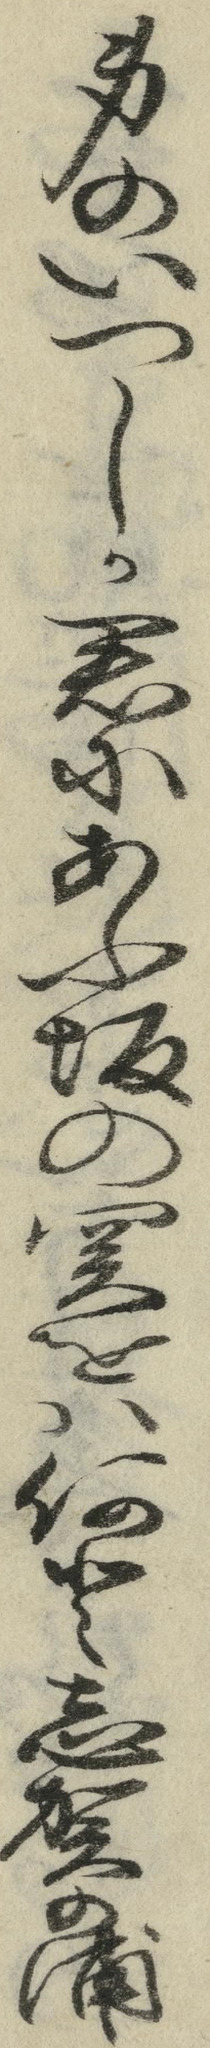身のいつしか君にあふ坂の関をは何と志賀の浦
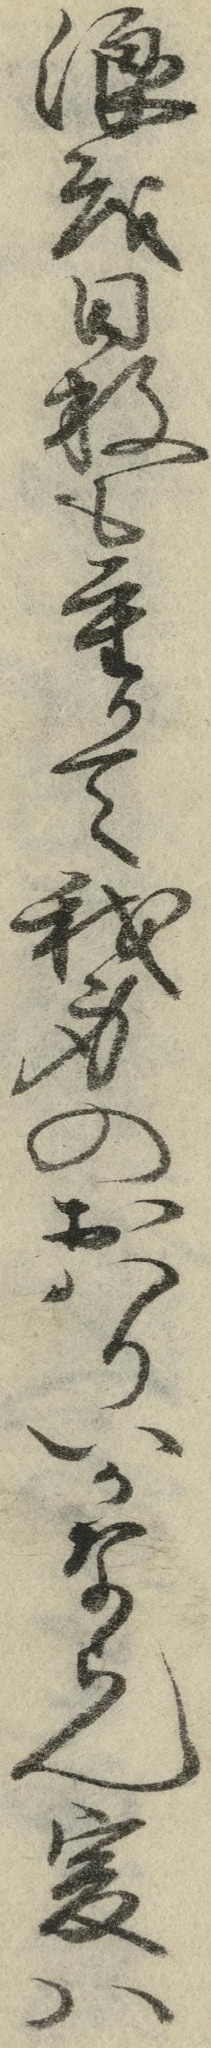浪も日数も重りて我身のおはりいかならん爰は
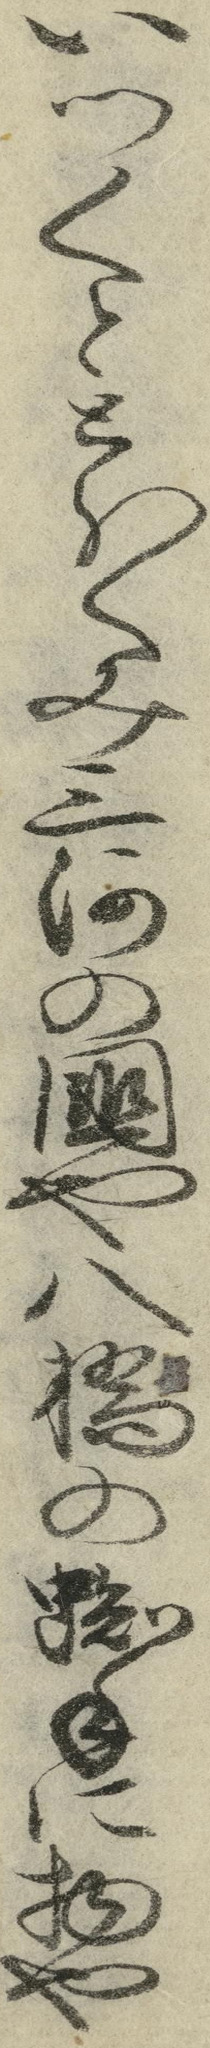いつくととほくみ三河の国や八橋の蜘手に物や
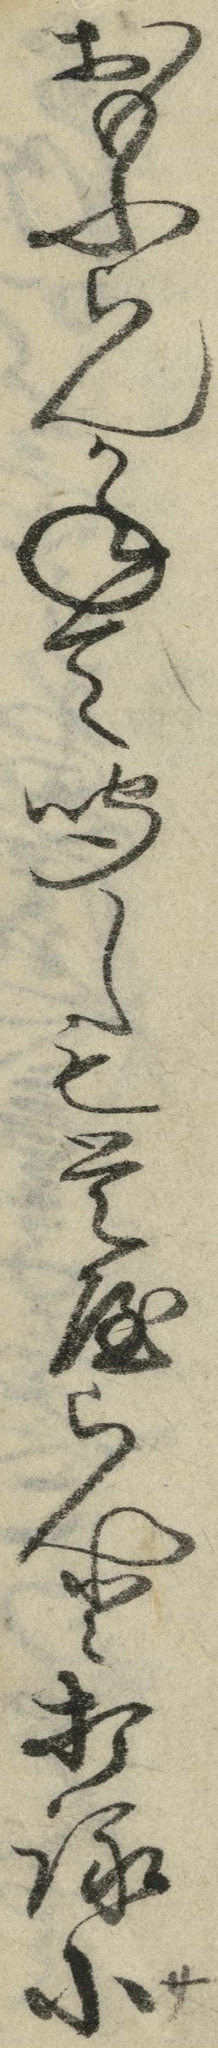おもふらんかねて聞しも是やらんと打詠小
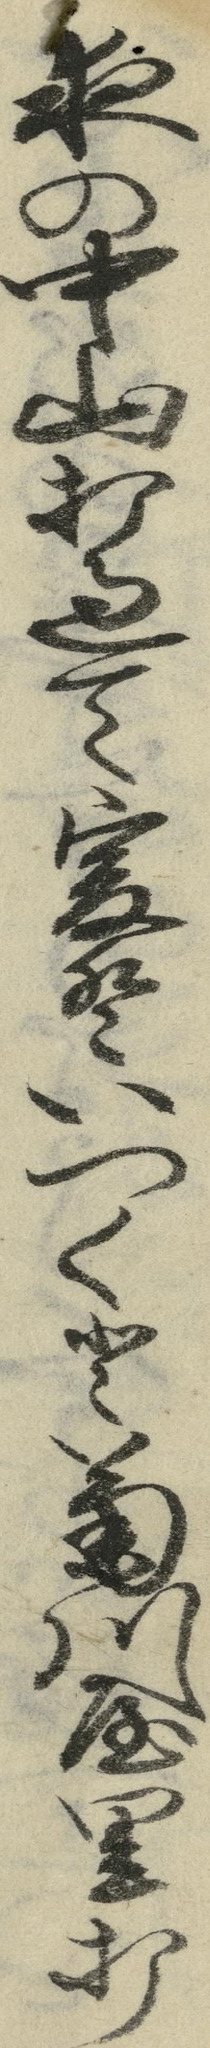夜の中山打過て爰はいつくと菊川や里打
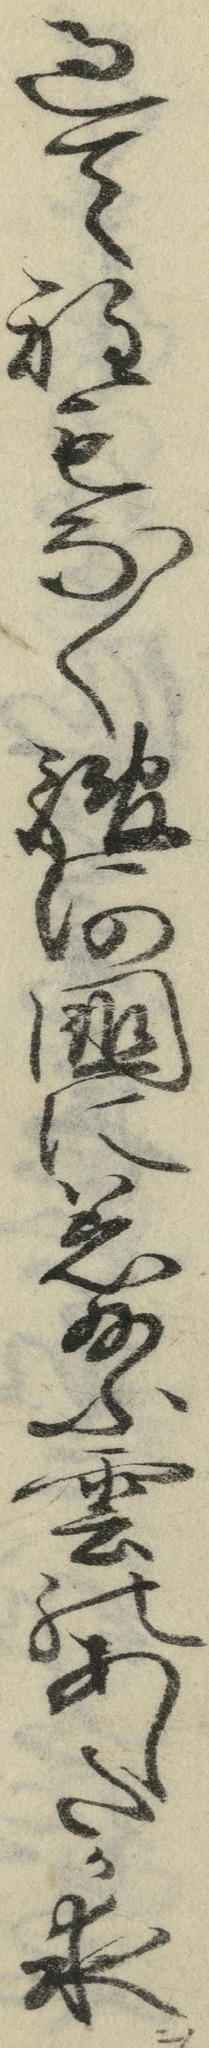過て程もなく駿河国に着給ふ雲のあしたか夜ヲ
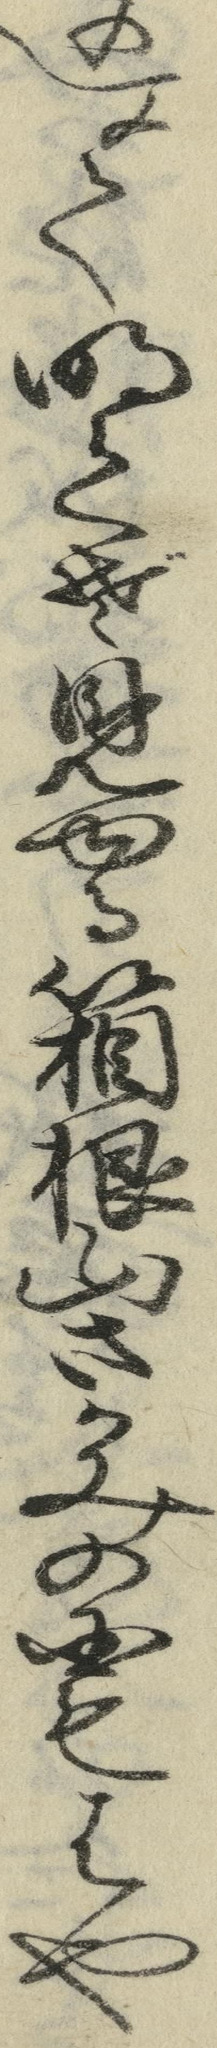込メて明てぞ見ゆる箱根山さかみの国もはや
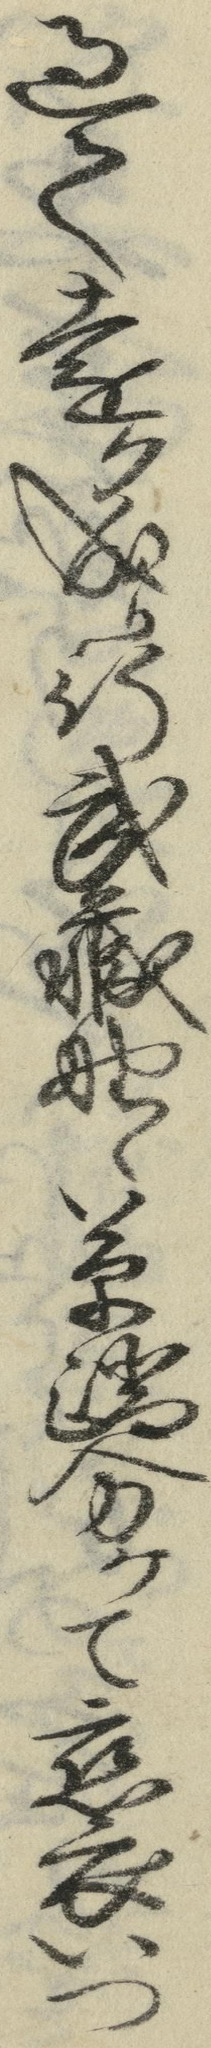過て遠ク成リ行武蔵野々草踏分ケて恋衣いつ
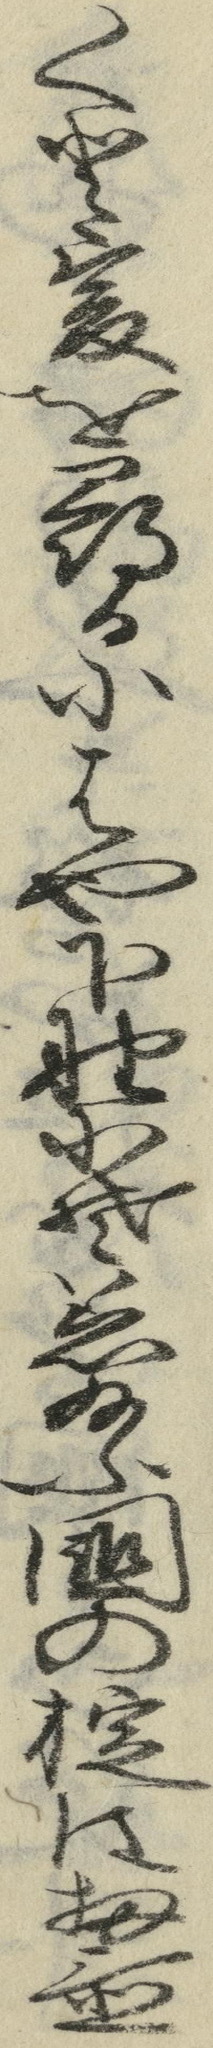くと爰を尋るにはや下野にそ着給ふ国の掟は扨置
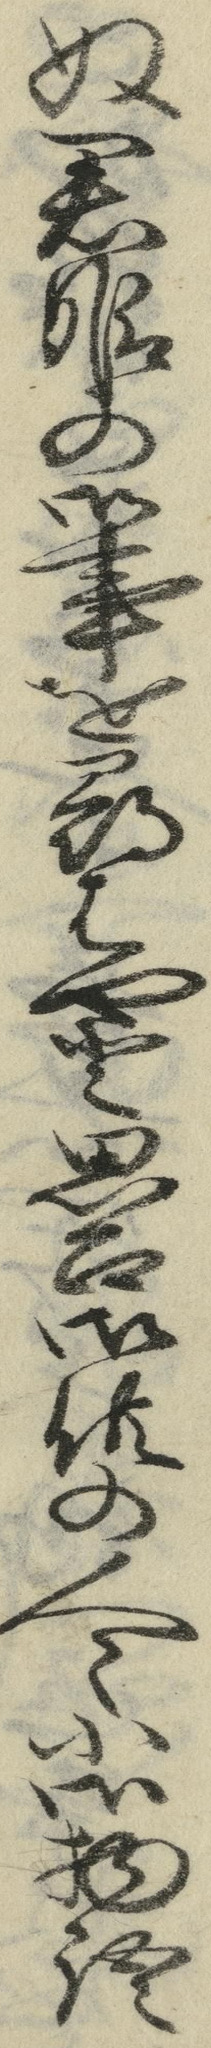ぬ君姫の筆を尋はやと思召御供の人々に御物語
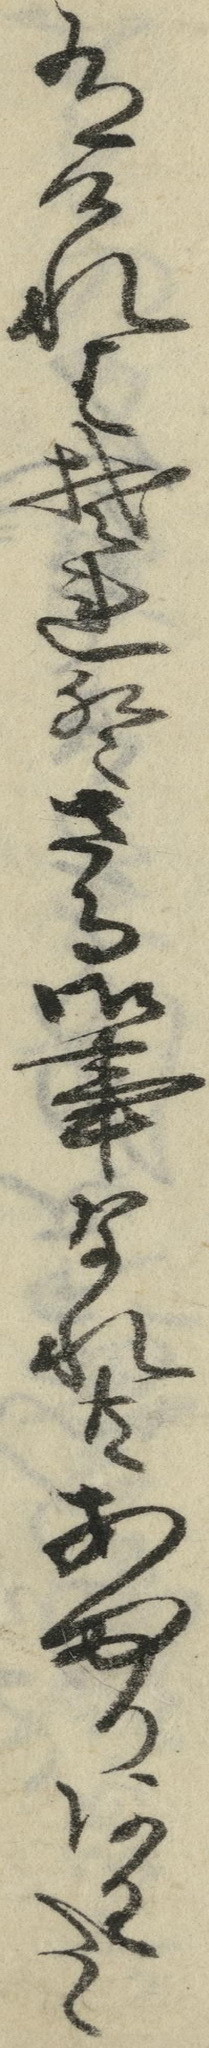有けれはそれはさる御事なれ共あまりあわたゝ
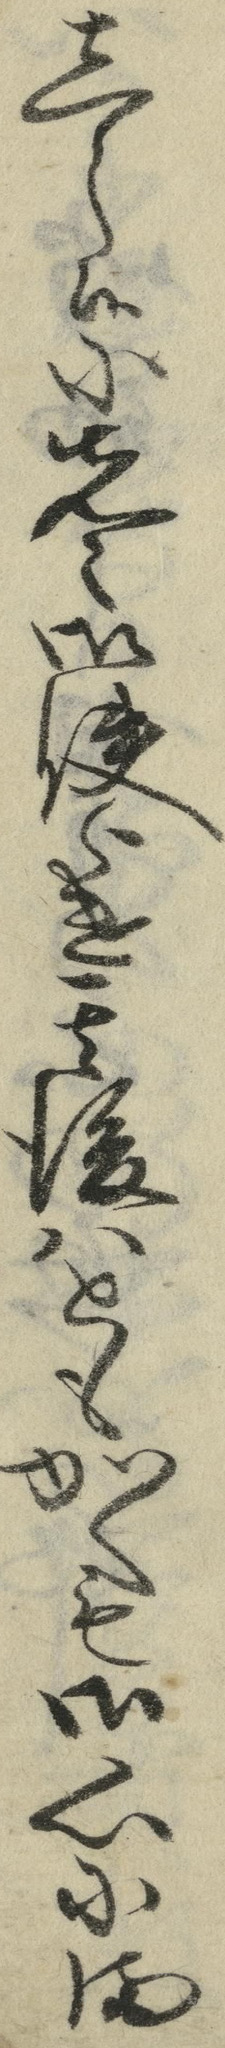しく候に先々御使被遣其後はともかくも御心にま
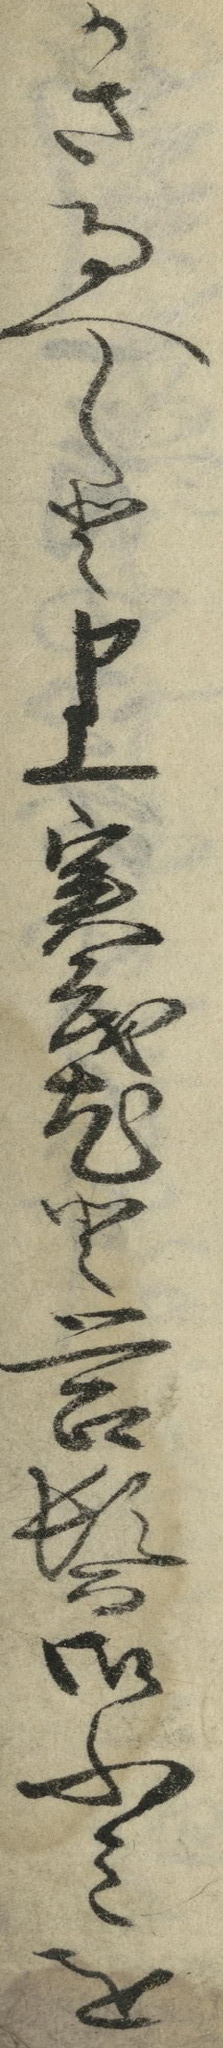かさるへしと申上実も尤と答頓て御ふみを

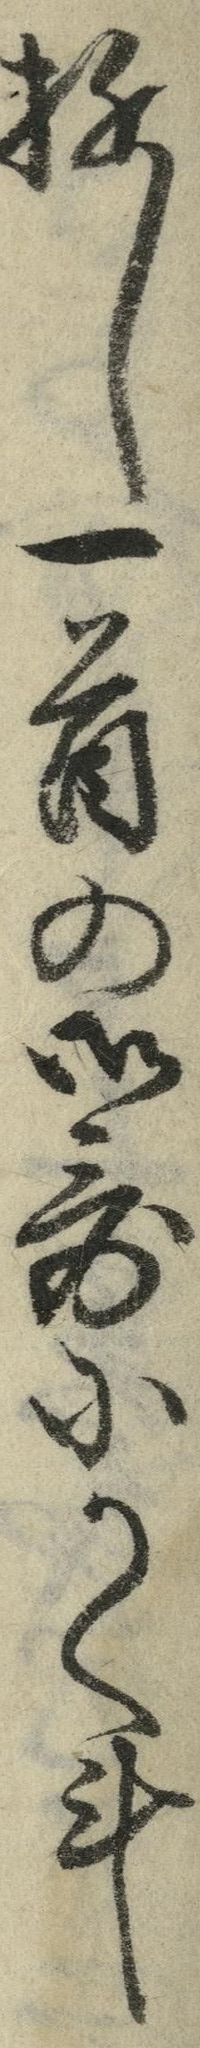遊し一首の御歌にかく斗
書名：浅間記
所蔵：東京大学地震研究所図書室 Earthquake Research Institute Library, The University of Tokyo, JAPAN
